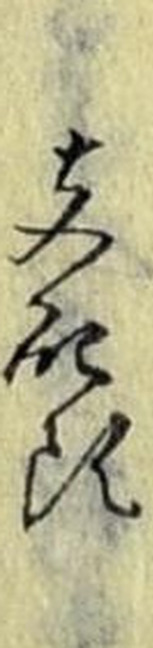支配頭
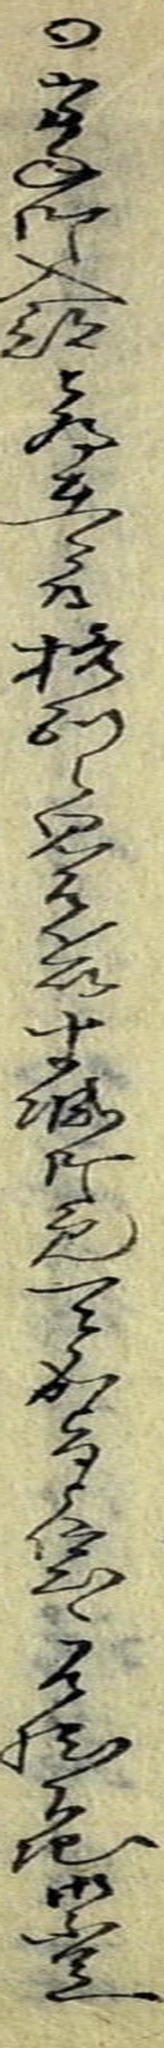○当年御入部被為在ニ付格別之思召を以半減御免可被成旨被仰出候乍然下地御不宜
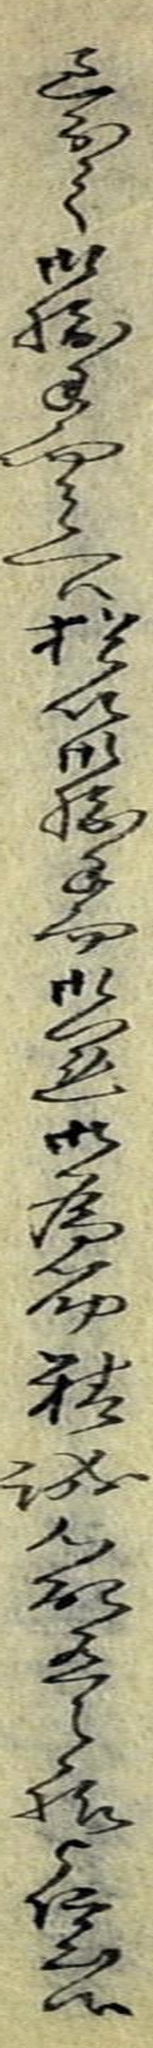過分之御勝手向ニ候へハ猶以御勝手向御運御為筋精誠心配有之候様被仰出候
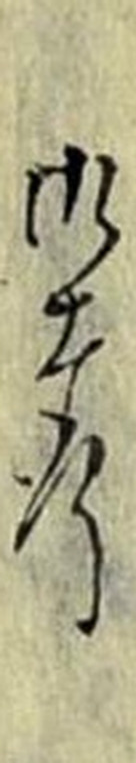御奉行
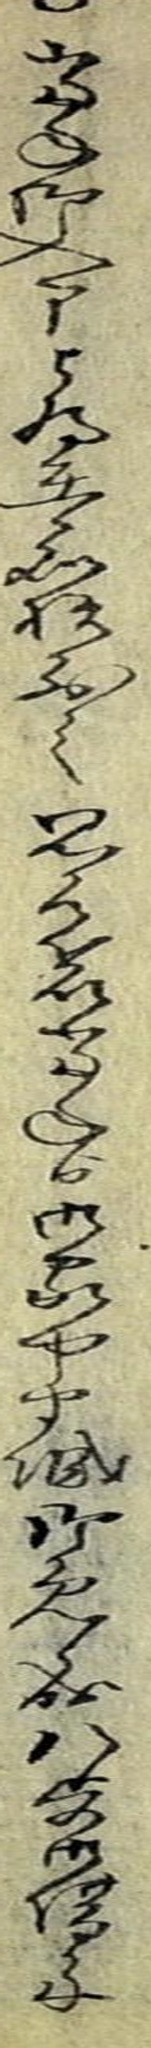○当年御入部被為在候処格別之思召を以当年ゟ御家中半減御免候成八歩御借米
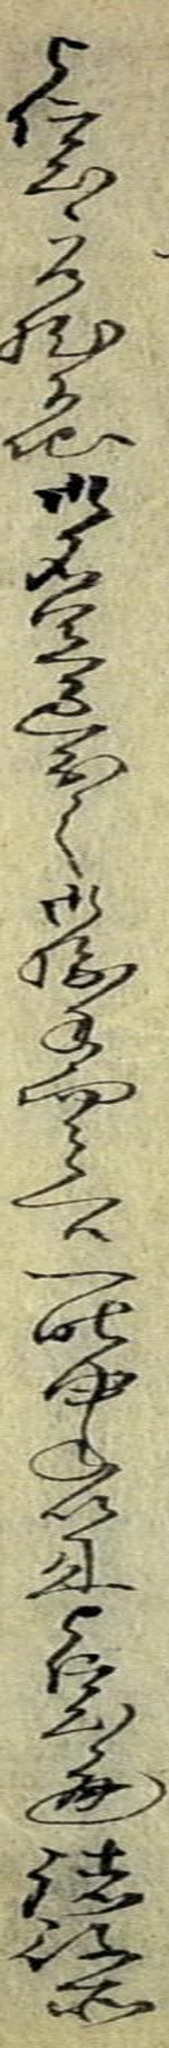被仰出候乍然下地御不宜過分之御勝手向ニ候へハ一昨申年以来被仰出候通諸役所
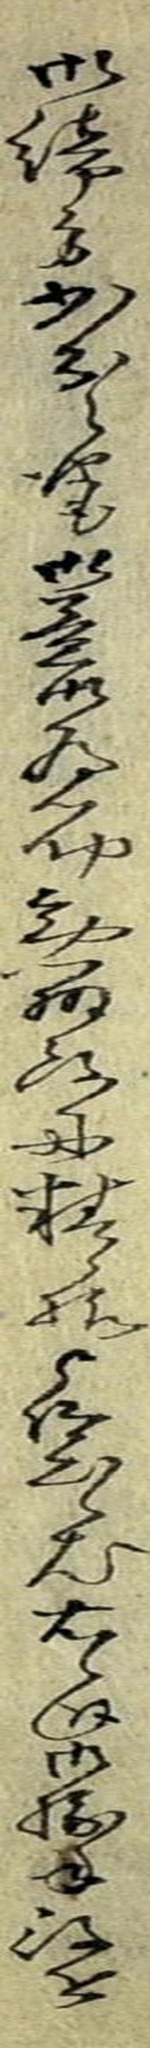御締方少分之儀も御益御為筋勘弁致丹精候様被仰出候尤右之通御勝手役を
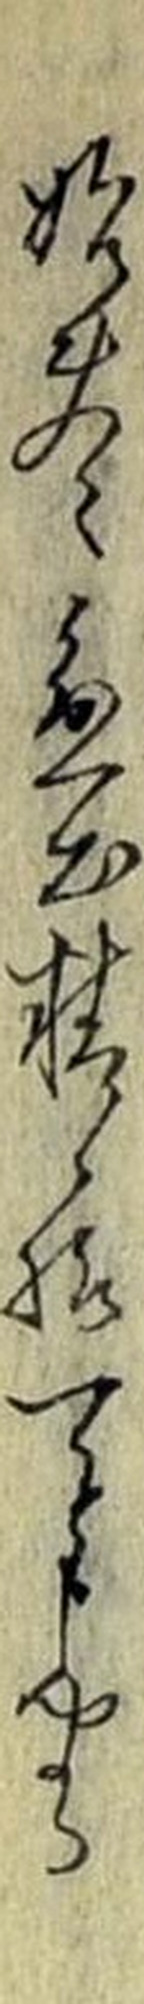始夫々愈出精候様可被申聞事
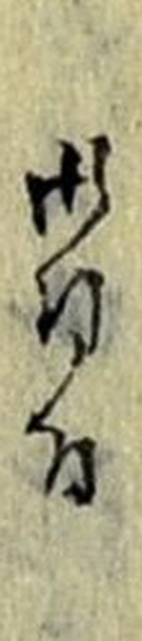御目付
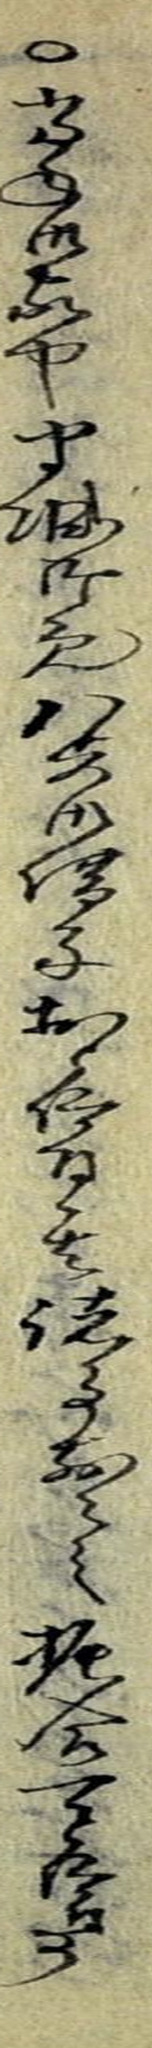○当年御家中半減御免八歩御借米於被仰付候者諸事前々之振合可被仰付事
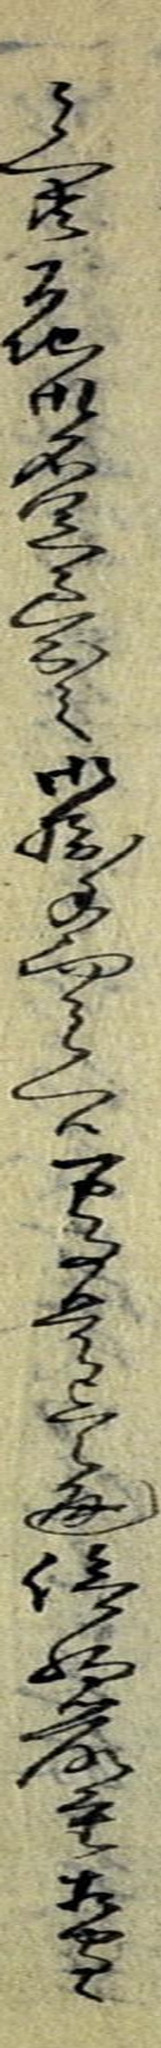ニ候へ共下地御不宜過分之御勝手向ニ候へハ万事是迄之通倹約厳重相守候
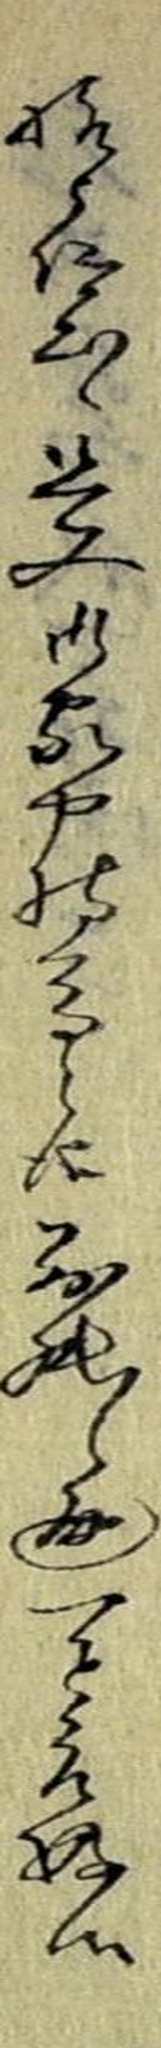様被仰出候且又御家中持馬之儀別紙之通可被取扱候
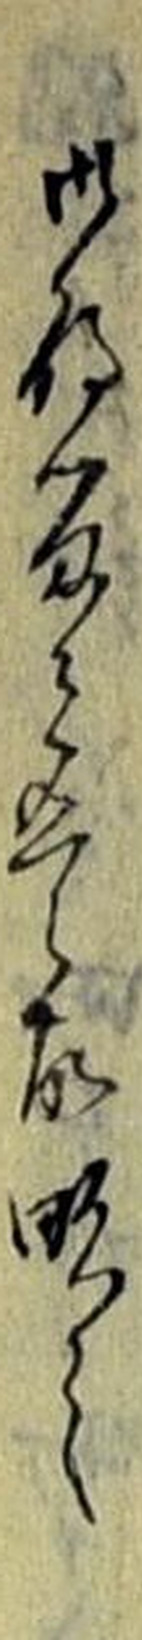御触留ニ有之故略之
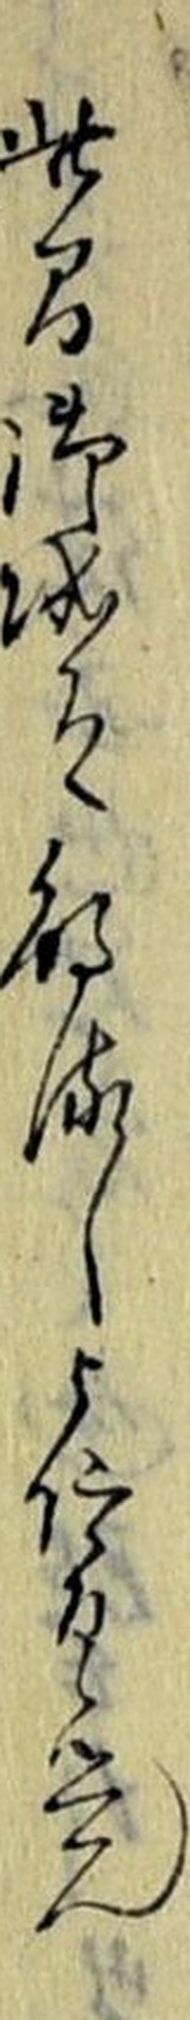此間御城下へ触流し被仰付候覚
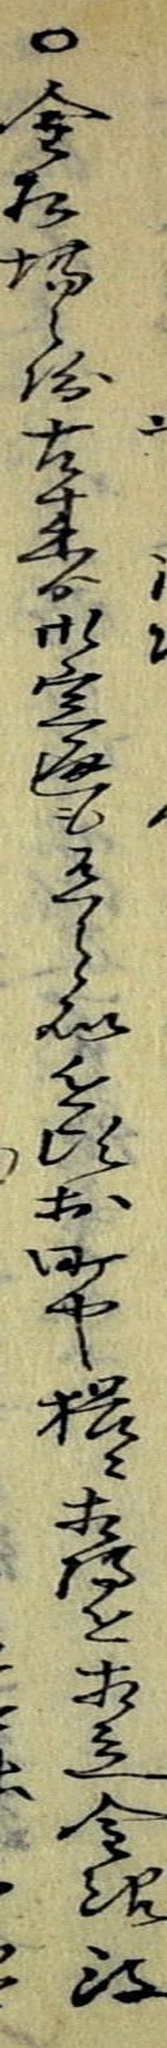○金相場之儀古来ゟ御定通も有之候処近頃於町中猥ニ相場を相立金銀致
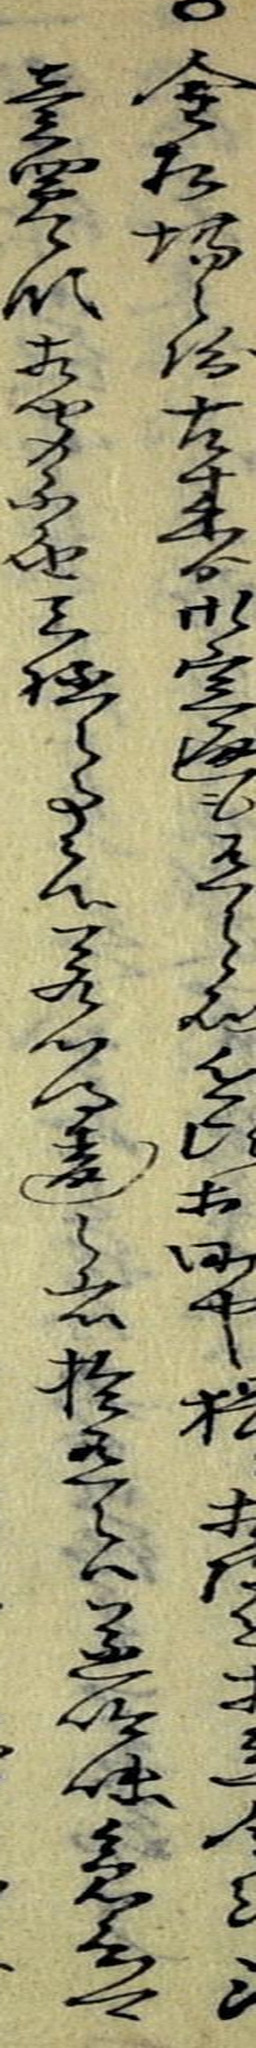売買候段相聞不届至極之事ニ候若心得違之者於有之ハ遂吟味急度可
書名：命令之部 五
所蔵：福井県文書館 Fukui Prefectural Archives
